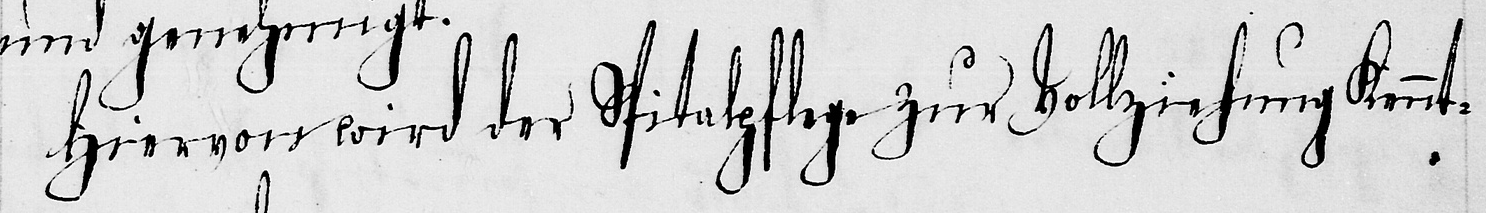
Hiervon wird der Spitalpflege zur Vollziehung Ken¬
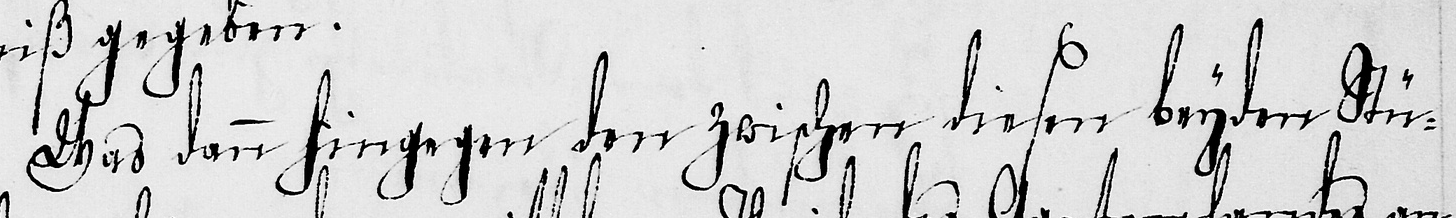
Was dann hingegen den zwischen diesen beyden Stü¬
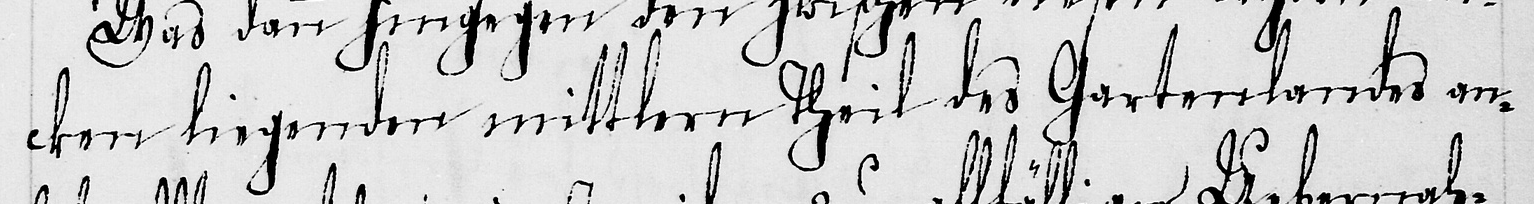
cken liegenden mittlern Theil des Gartenlandes an¬
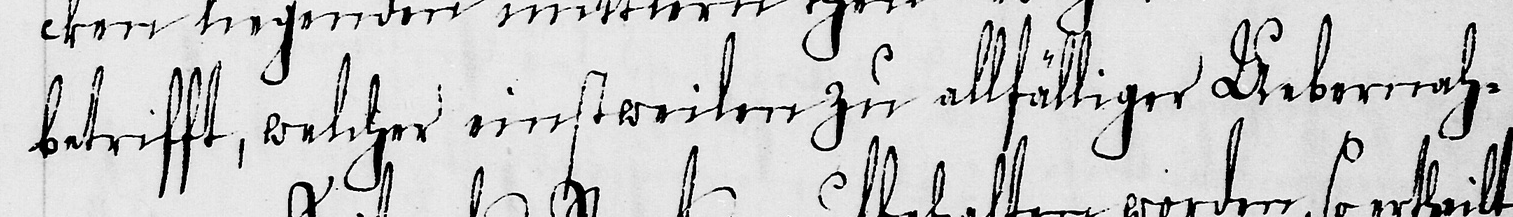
betrifft, welcher einstweilen zu allfälliger Uebernah¬
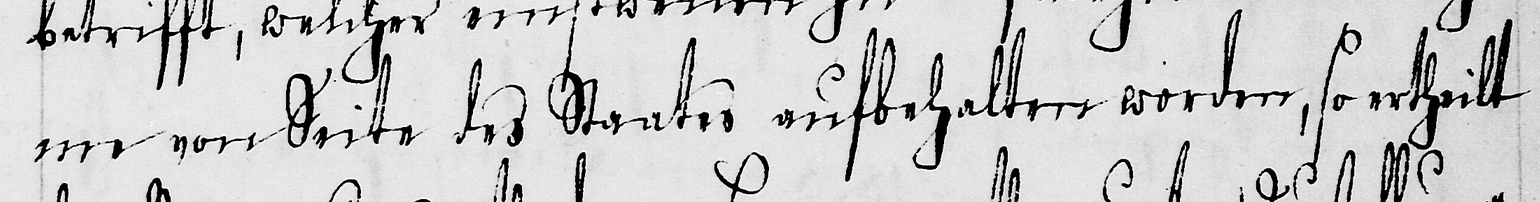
me von Seite des Staates aufbehalten worden, so ertheilt
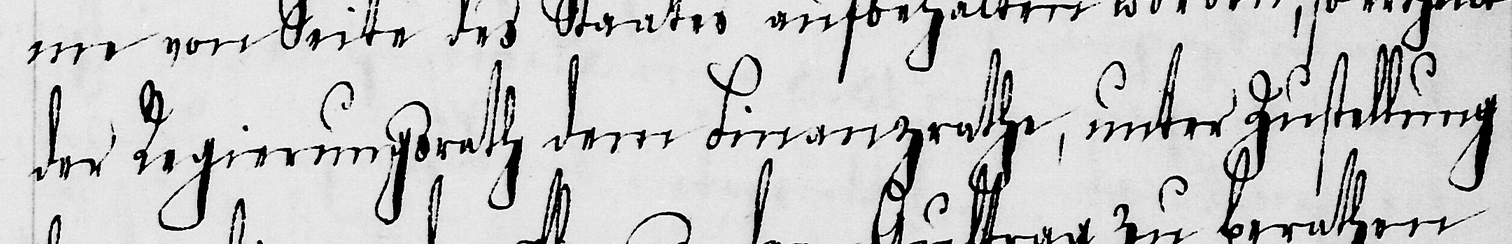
der Regierungsrath dem Finanzrathe, unter Zustellung
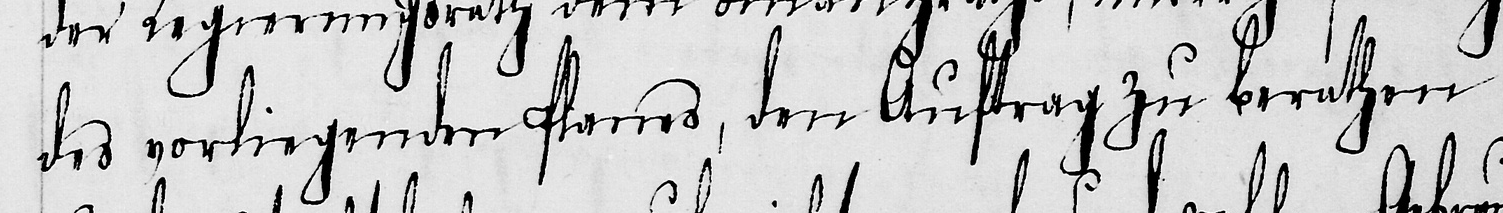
des vorliegenden Planes, den Auftrag zu berathen
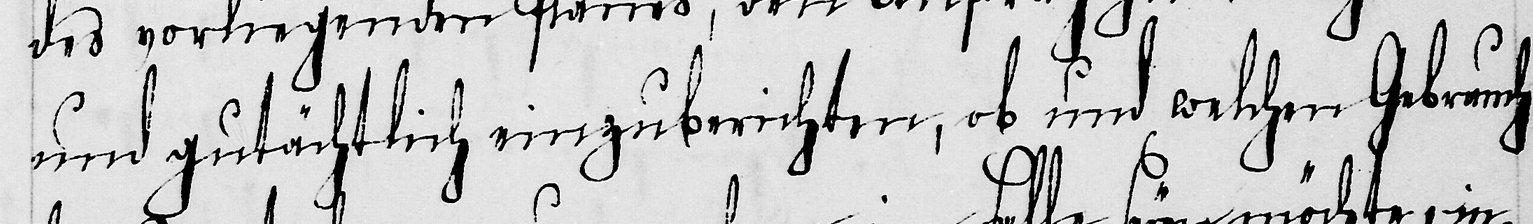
und gutächtlich einzuberichten, ob und welchen Gebra¬
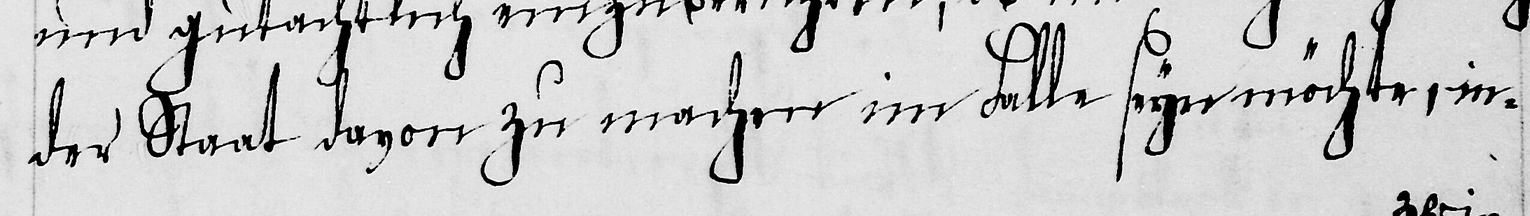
der Staat davon zu machen im Falle seyn möchte, in-
